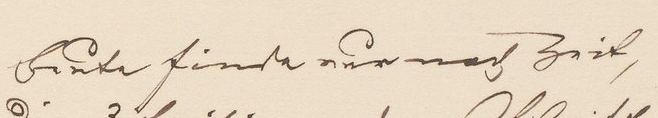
Heute finde nur noch Zeit,
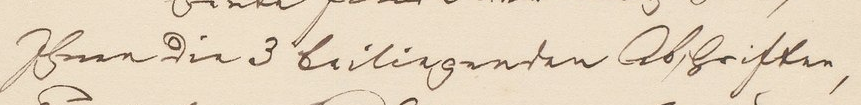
Ihnen die 3 beiliegenden Abschriften,
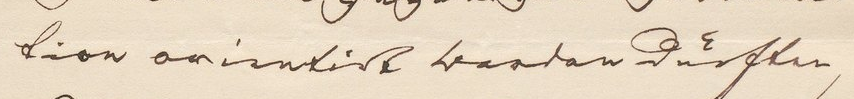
tion orientirt werden dürften,
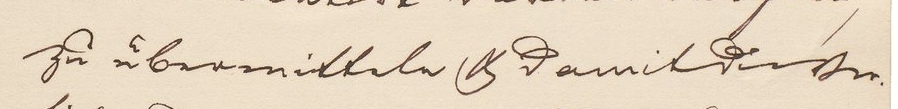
zu übermitteln & damit die Ver-
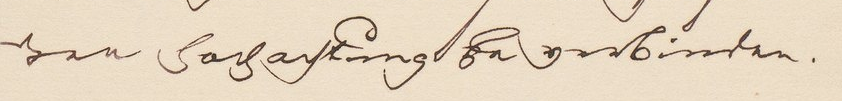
chen Hochachtung zu verbinden.
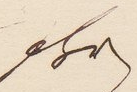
Escher
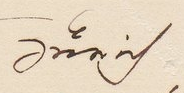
Zürich
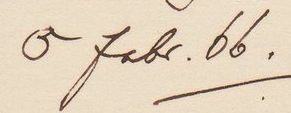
5 Febr. 66.
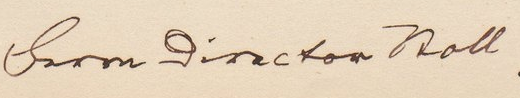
Herrn Director Stoll
